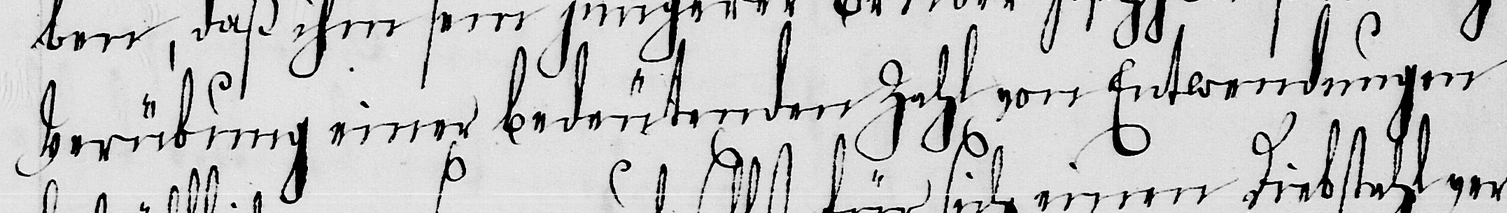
Verübung einer bedeutenden Zahl von Entwendungen
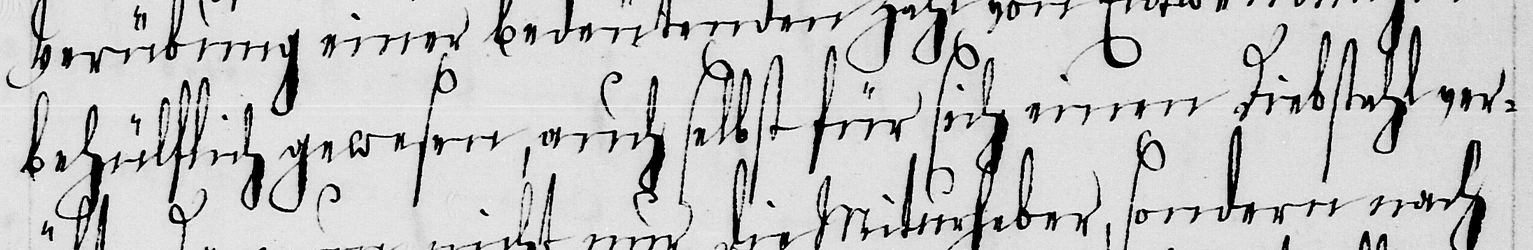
behülflich gewesen, auch selbst für sich einen Diebstahl ver¬
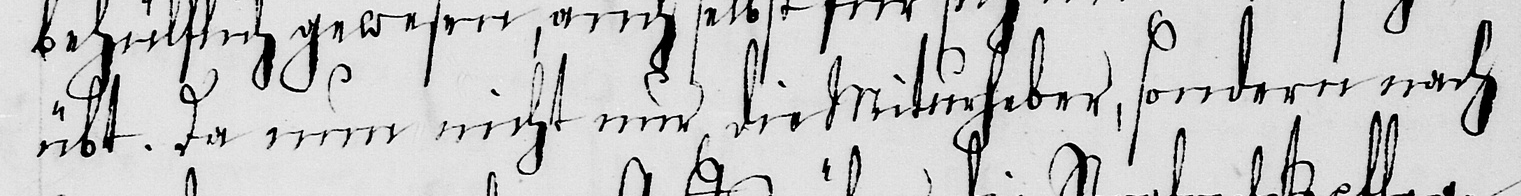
übt. Da nun nicht nur die Miturheber, sondern nach
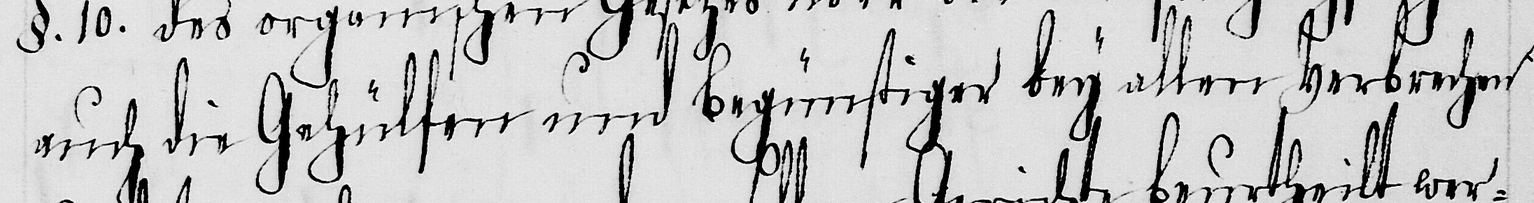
auch die Gehülfen und Begünstiger bey allen Verbrechen
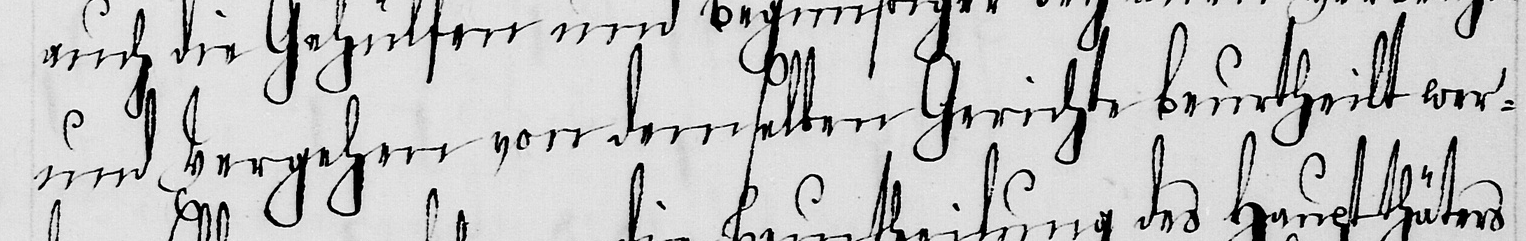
und Vergehen von demselben Gerichte beurtheilt wer¬
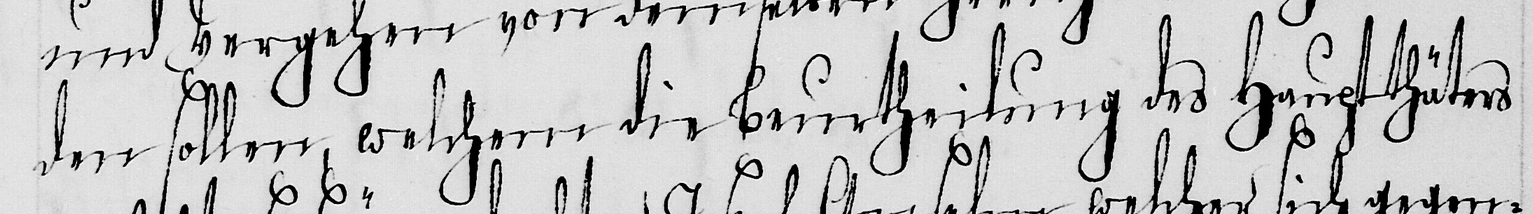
den sollen, welchem die Beurtheilung des Hauptthäte¬
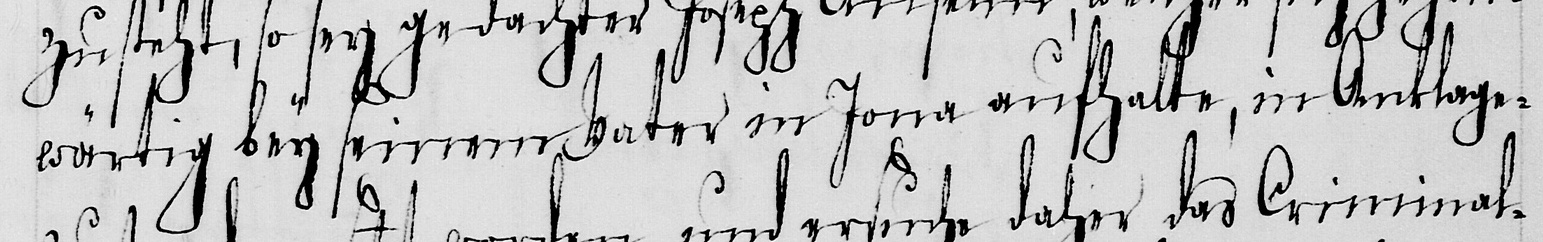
wärtig bey seinem Vater in Jona aufhalte, in Anklage¬
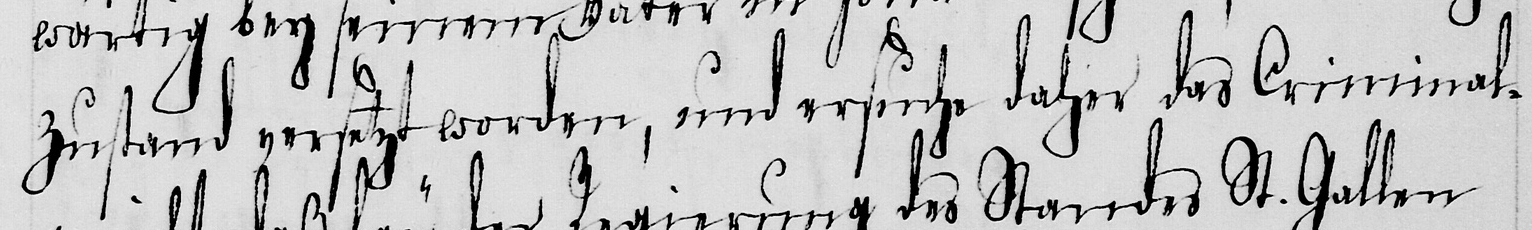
zustand versetzt worden, und ersuche daher das Criminal¬
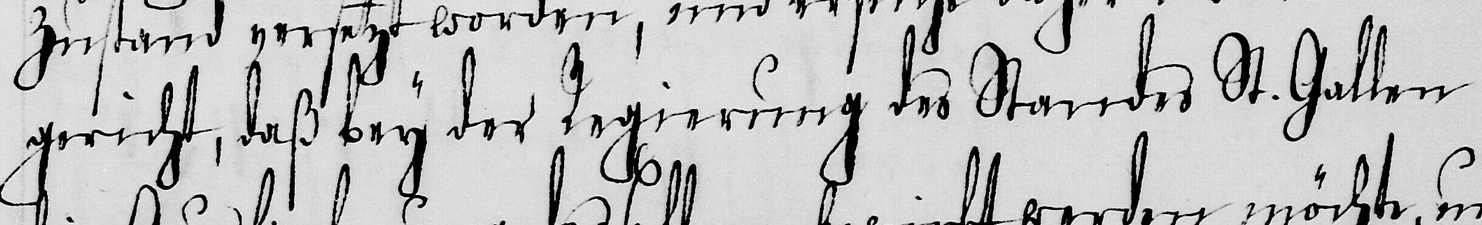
gericht, daß bey der Regierung des Standes St. Gallen
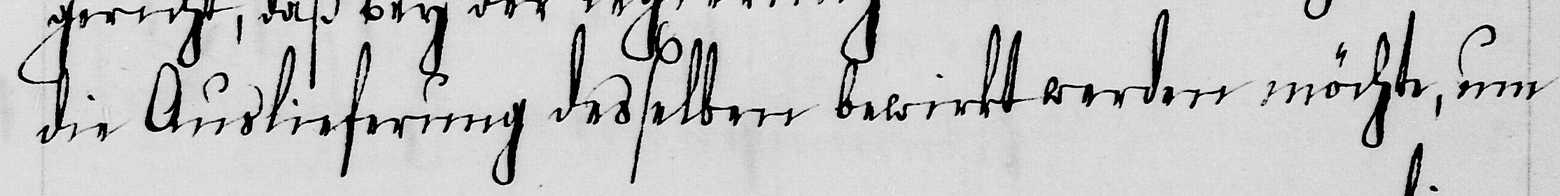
die Auslieferung desselben bewirkt werden möchte, um
